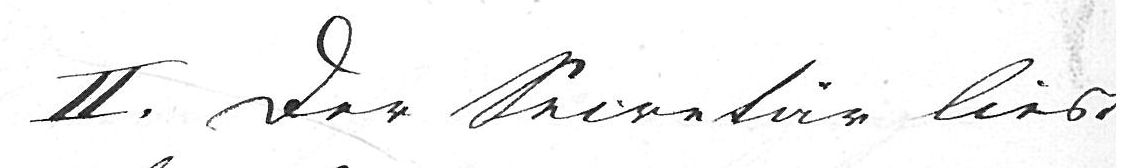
II. Der Secretär liest
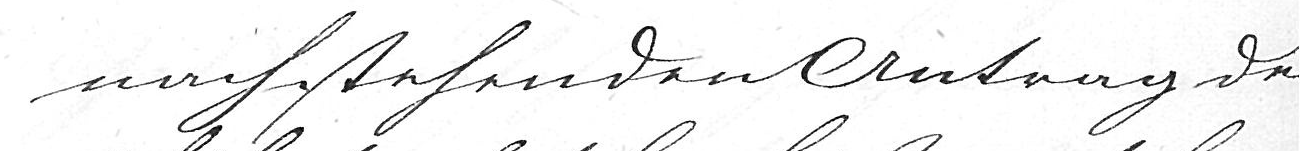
nachstehenden Antrag der
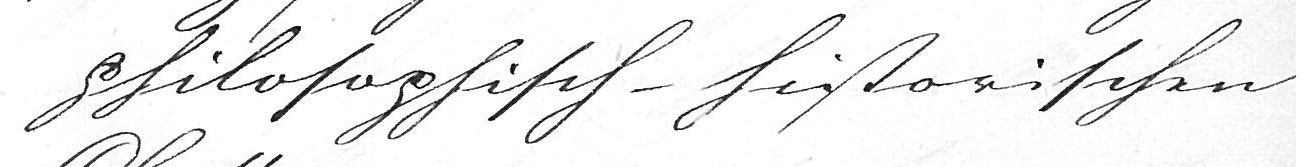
philosophisch-historischen
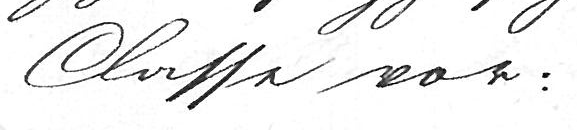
Classe vor:
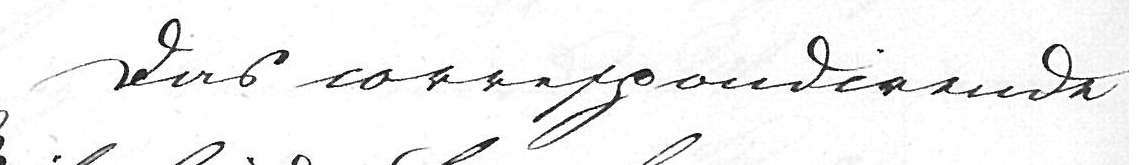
Das correspondirende
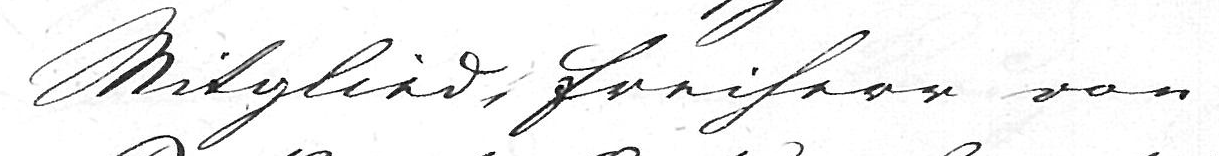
Mitglied, Freiherr von
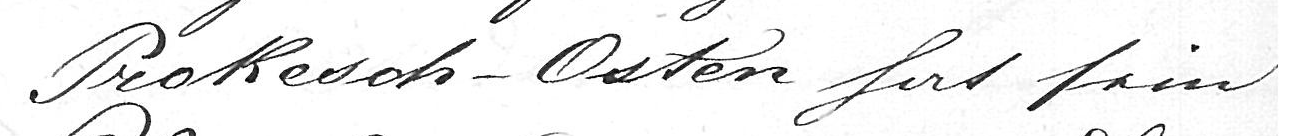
Prokesch-Osten hat sein
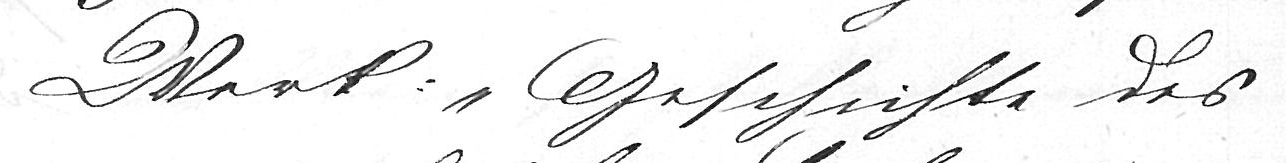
Werk: "Geschichte des
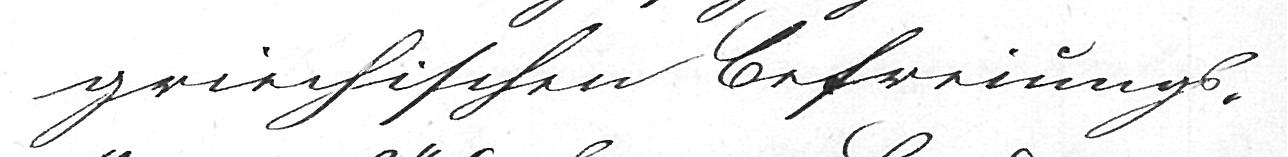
griechischen Befreiungs-
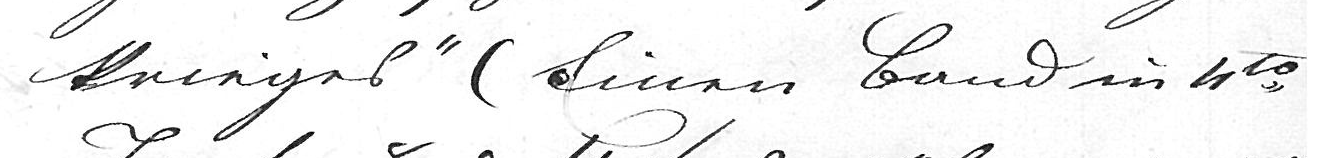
krieges" (Einen Band in 4to
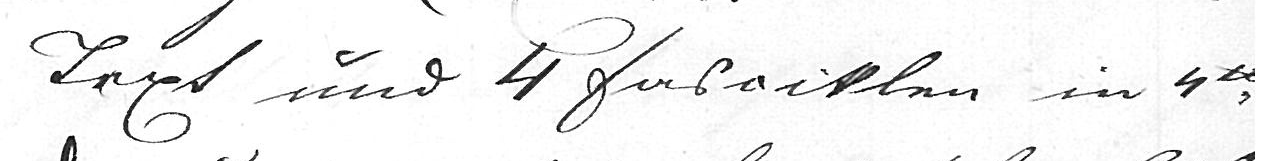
Text und 4 Fasciklen in 4to
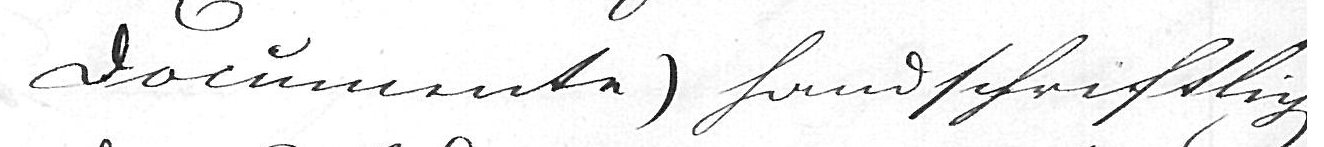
Documente) handschriftlich
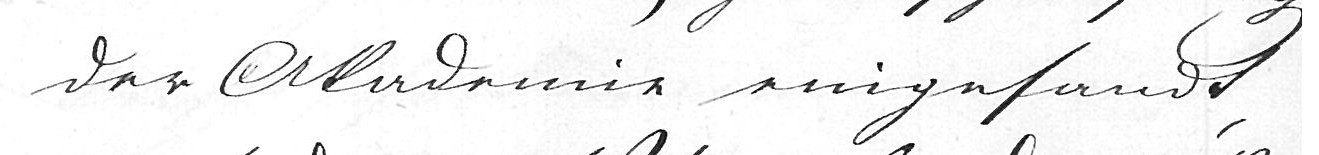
der Akademie eingesandt,
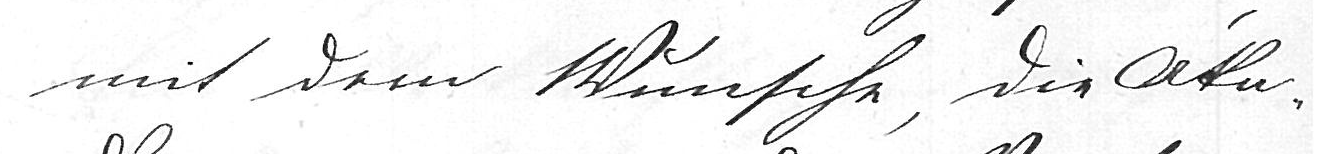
mit dem Wunsche, die Aka-
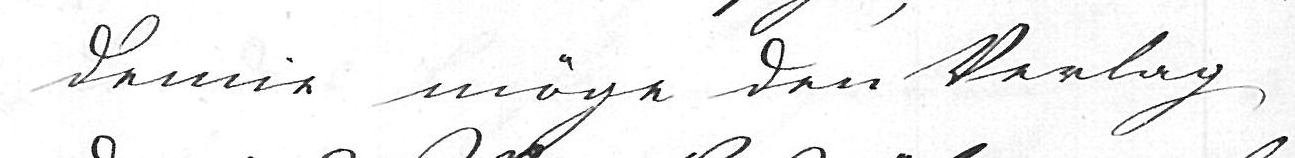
demie möge den Verlag
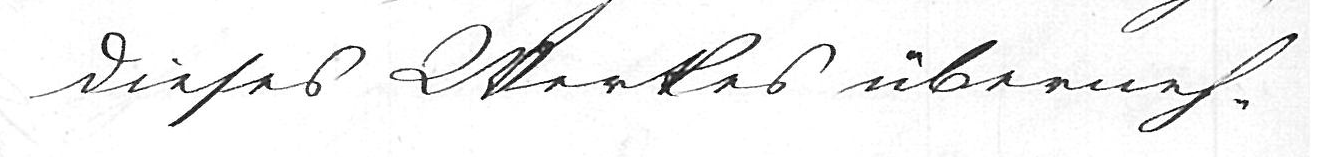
dieses Werkes überneh-
